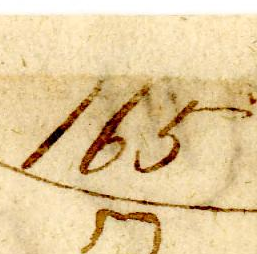165
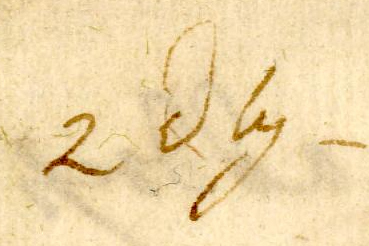2^dly-
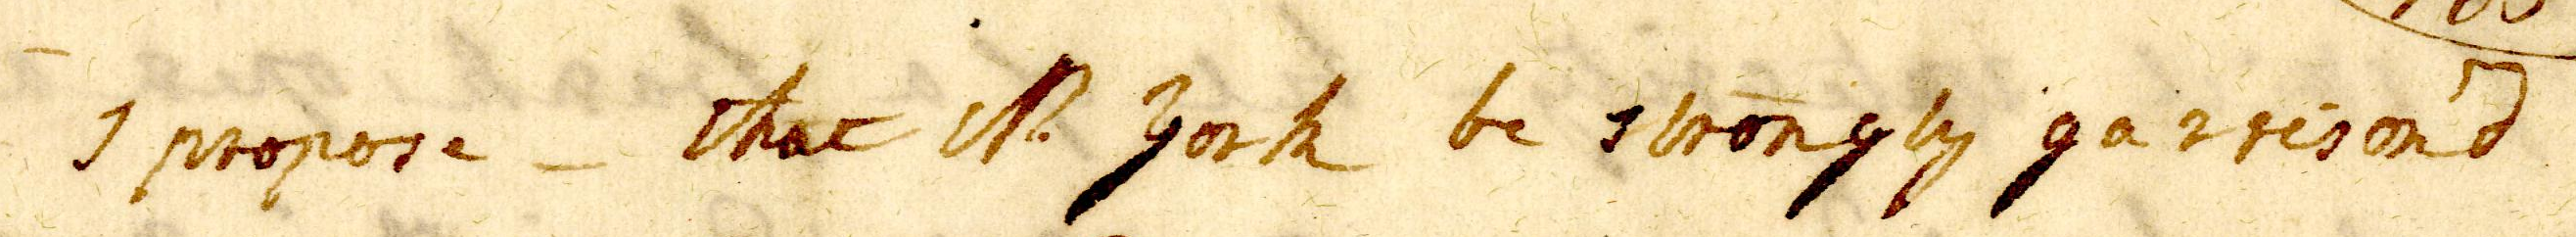I propose- that N. York be strongly garrison'd
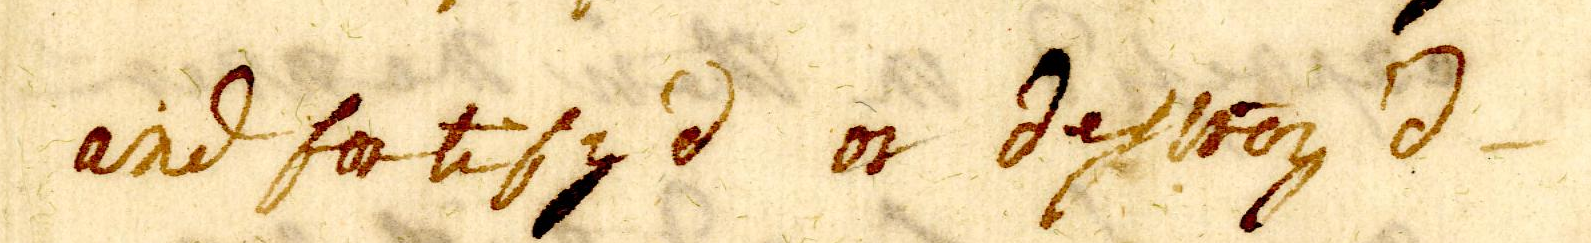and fortify'd or destroy'd-
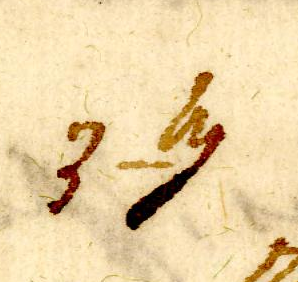3^ly
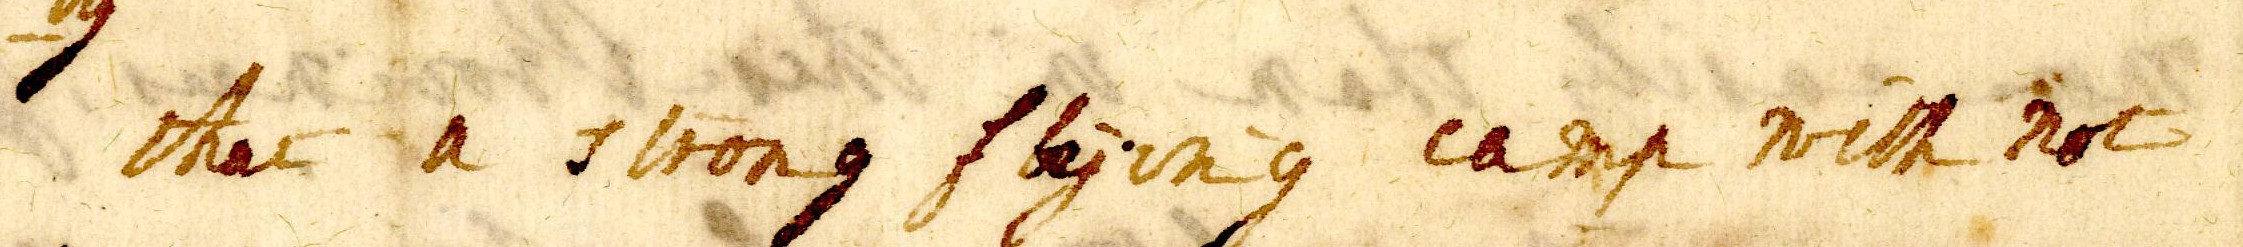that a strong flying camp with not
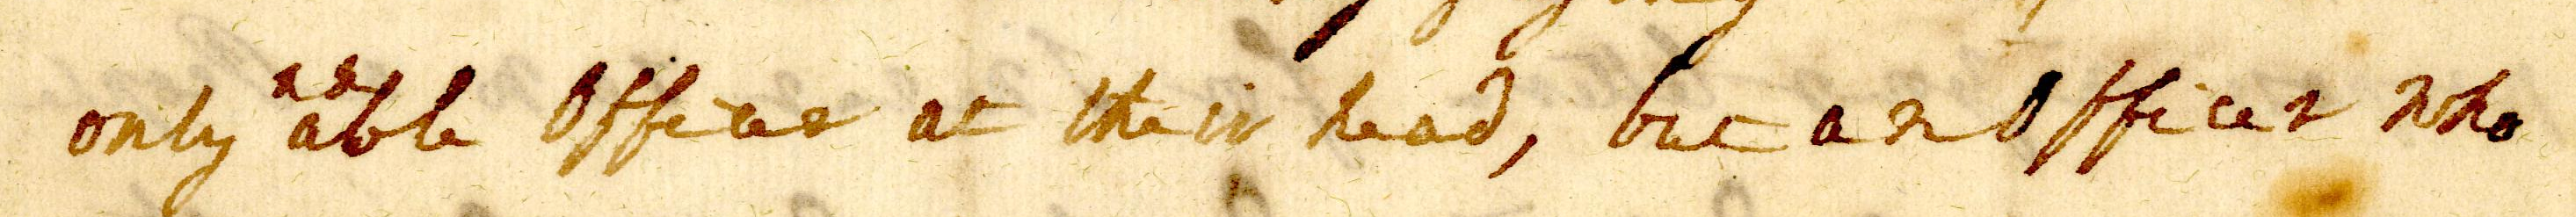only able Officer at their head, but an Officer who
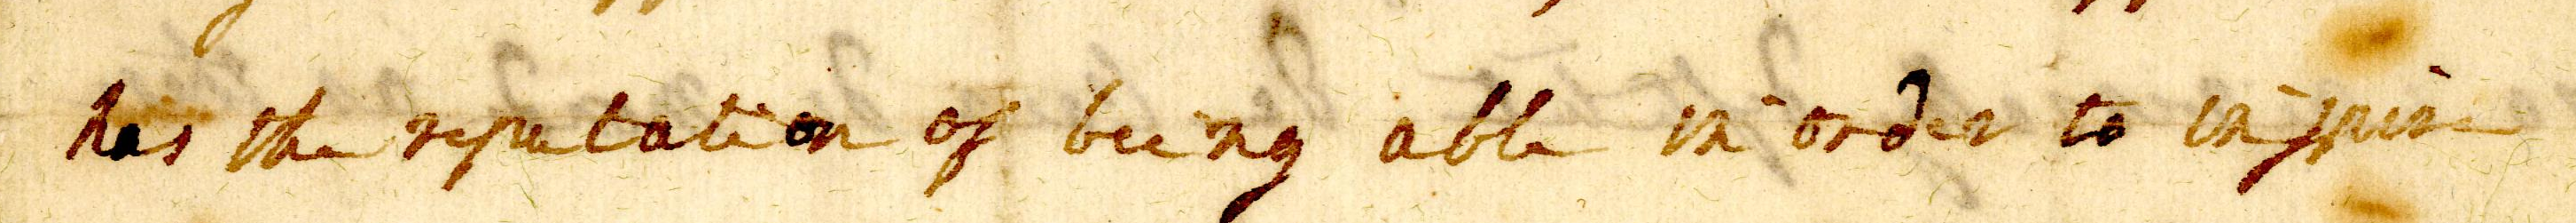has the reputatation of being able in order to inspire
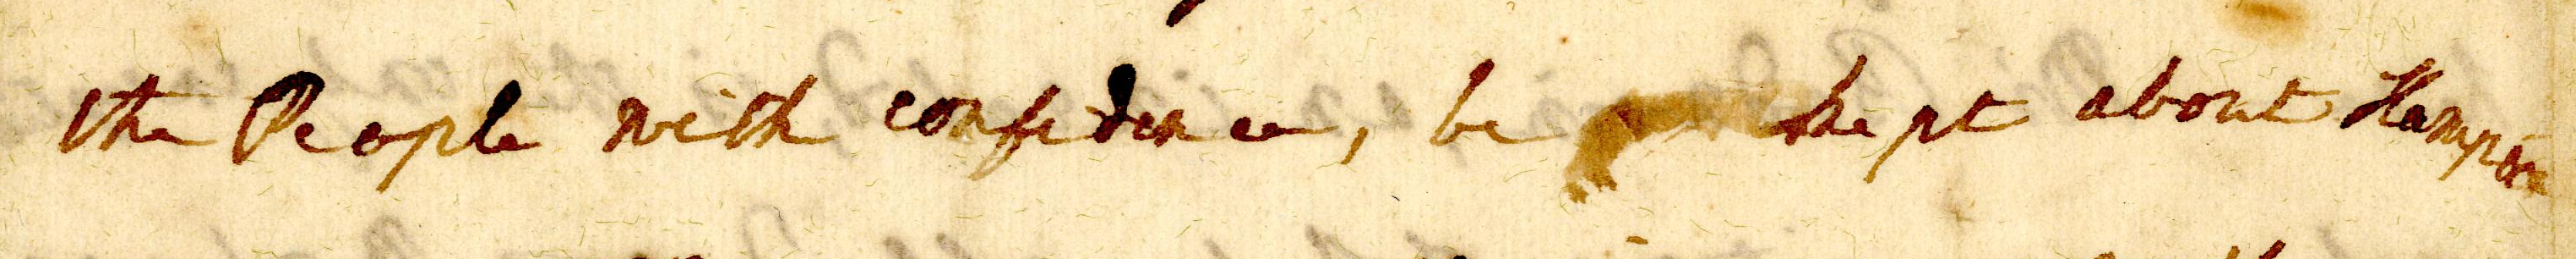the People with confidence; be kept about Harper
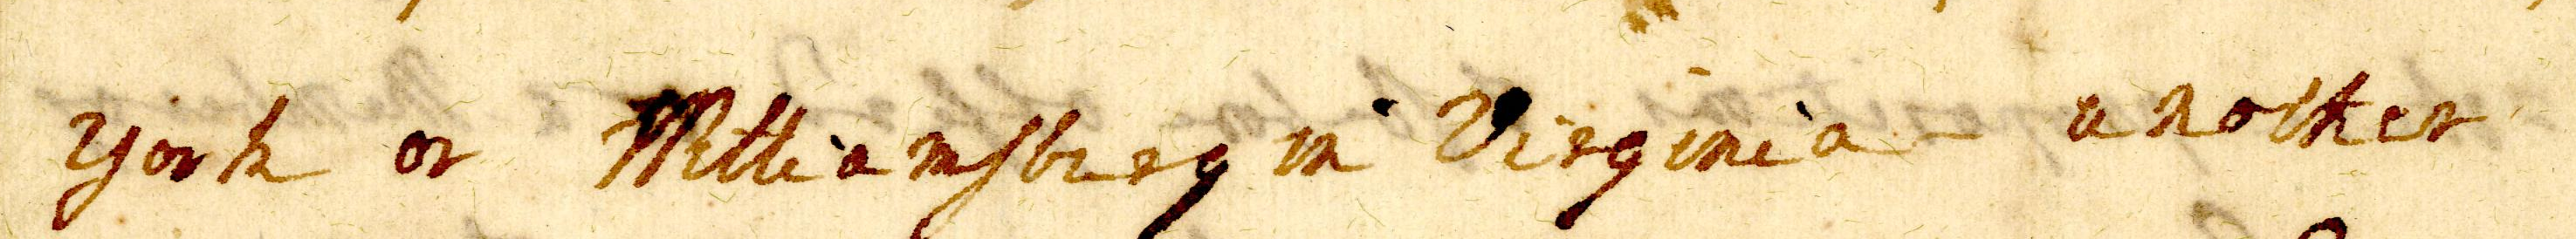York or Williamsburg in Virginia another
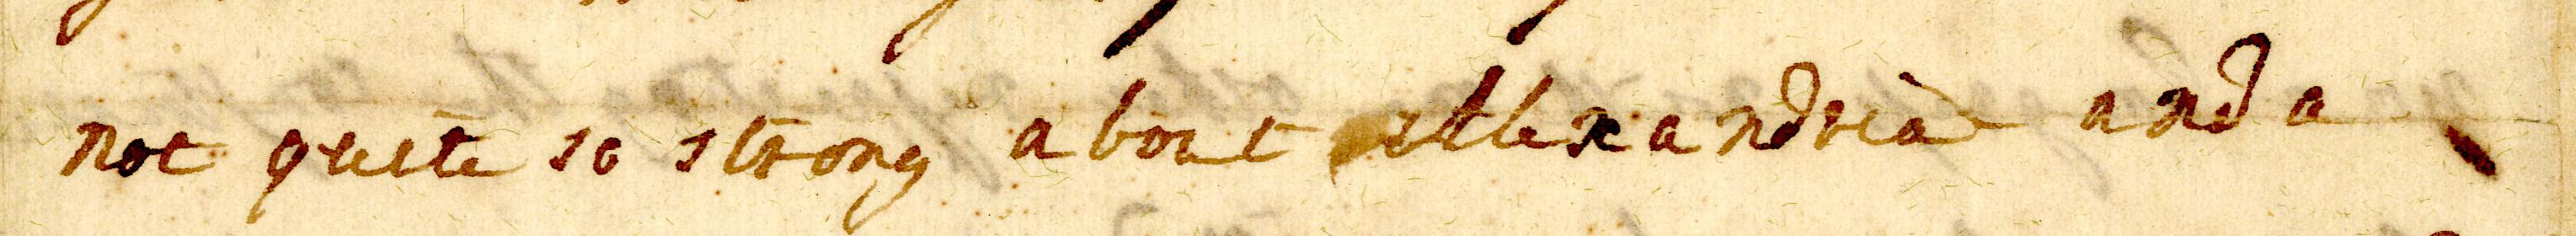not quite so strong about Alexandria and a
